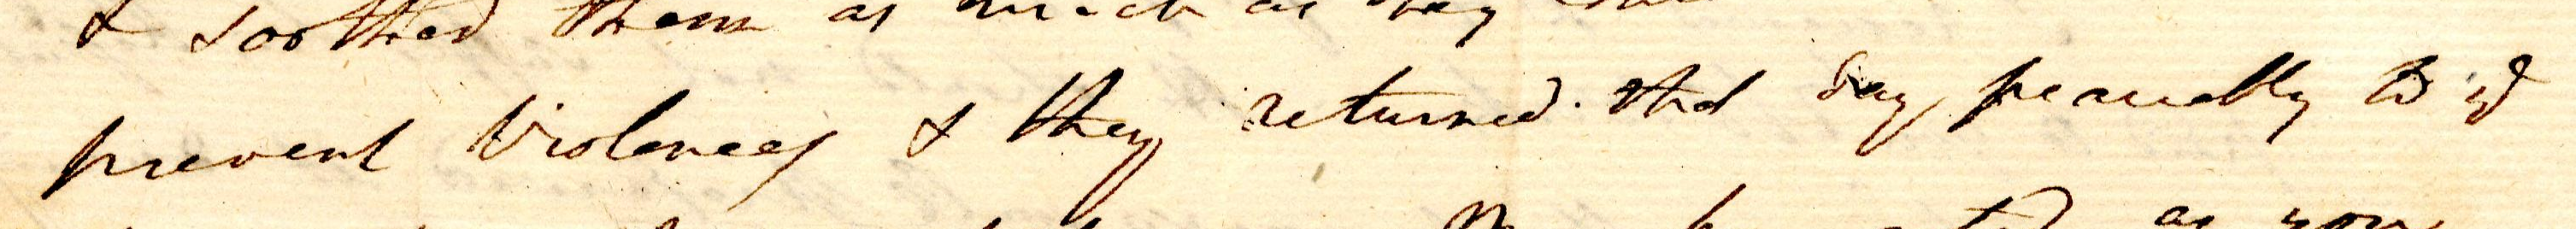prevent Violences & they returned that by peaceably w y^e
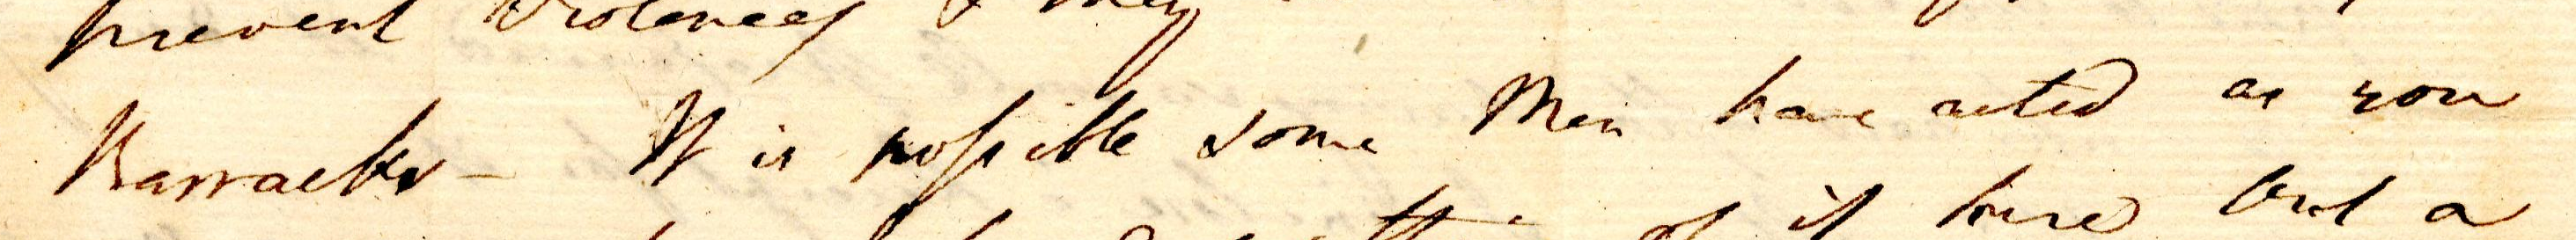Karracbe- It is possible some Men hae rited as rou
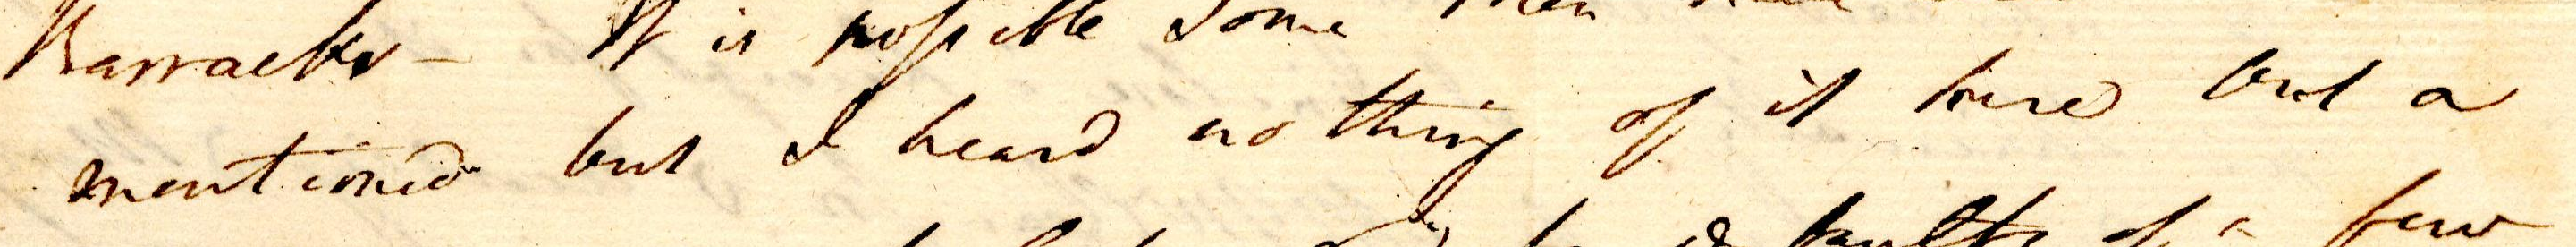mentioned but I heard no thing of it here but a
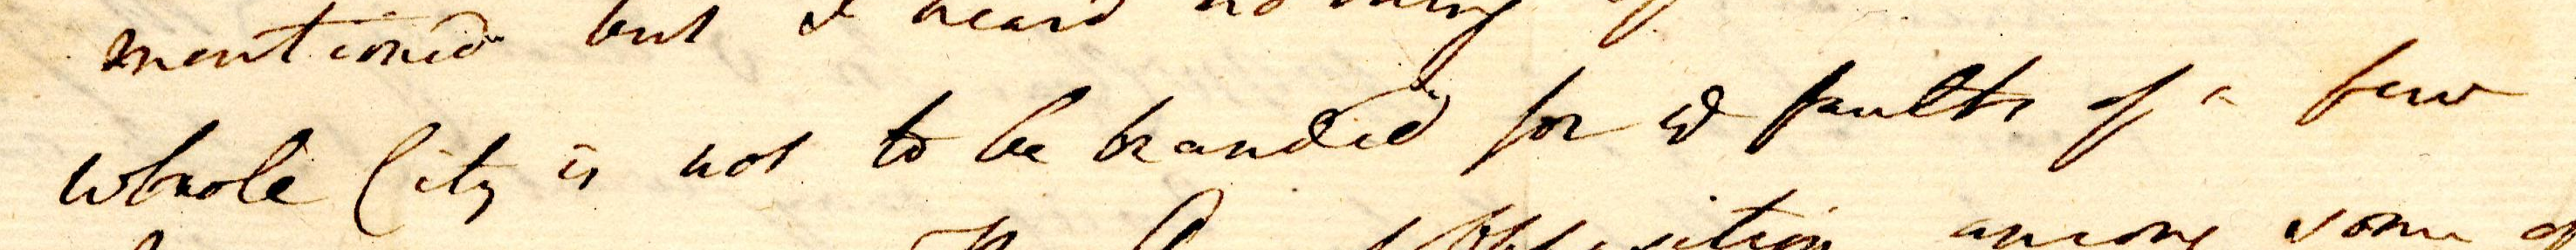whole City is not to be branded for y^e faults of a few
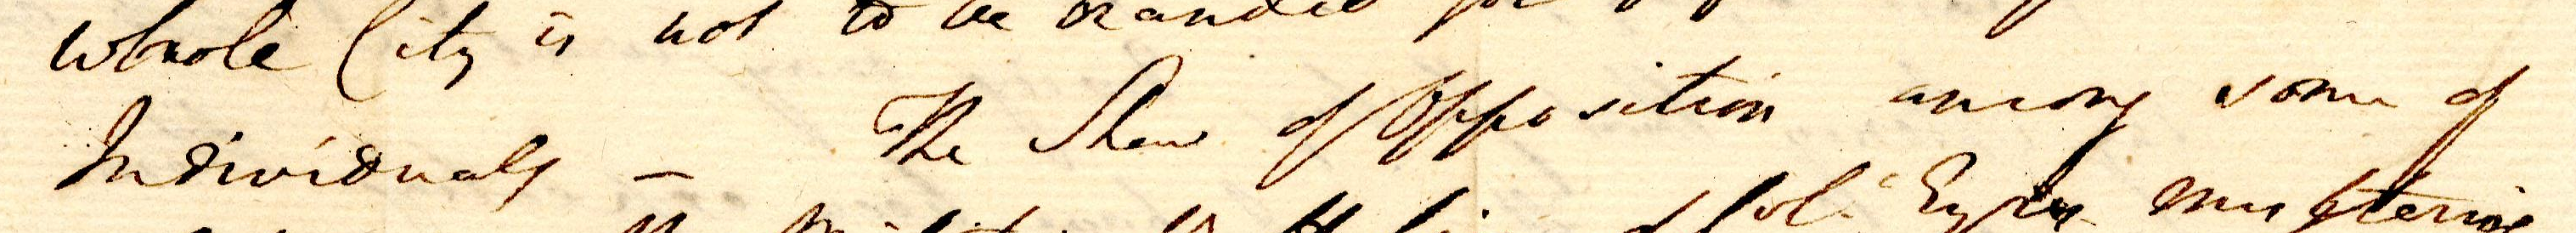Individuals. The Show of Opposition among some of
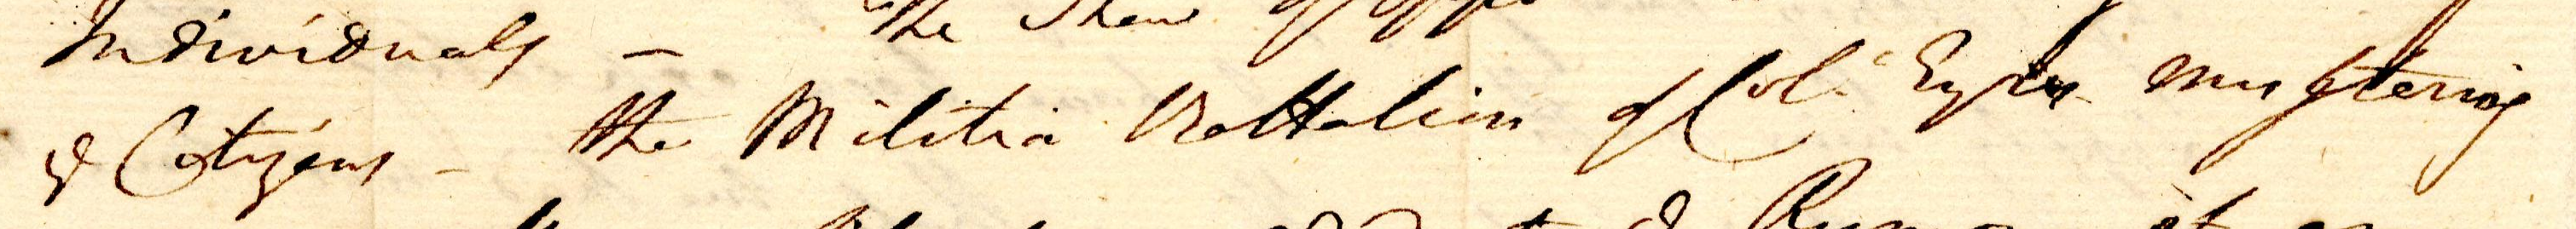y^e Citizens- the Militia Battalion of Colo. Eyres mustering
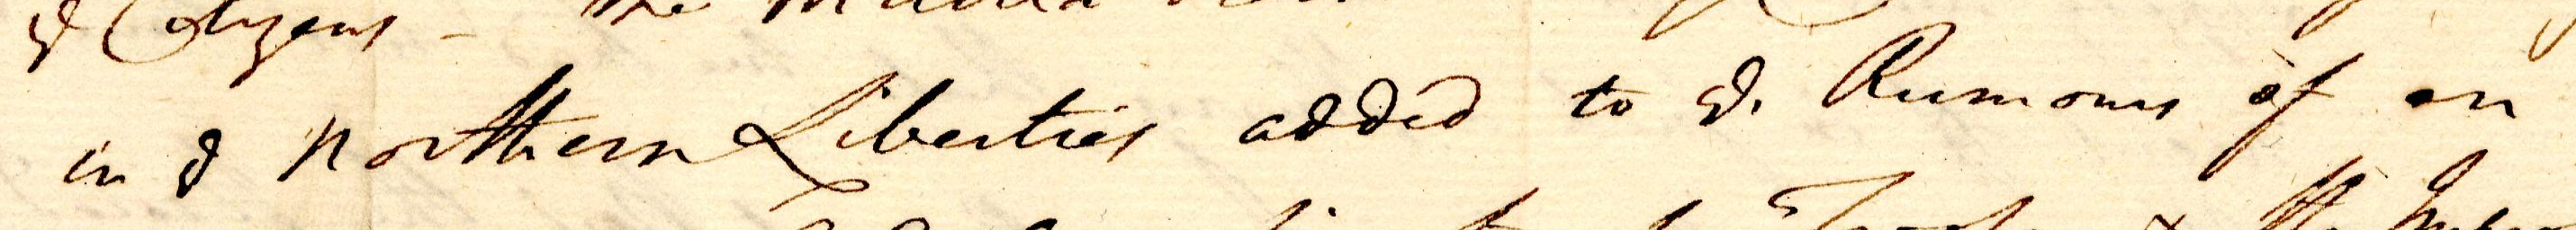in y^e Northern Liberties added to y^e Rumours of an
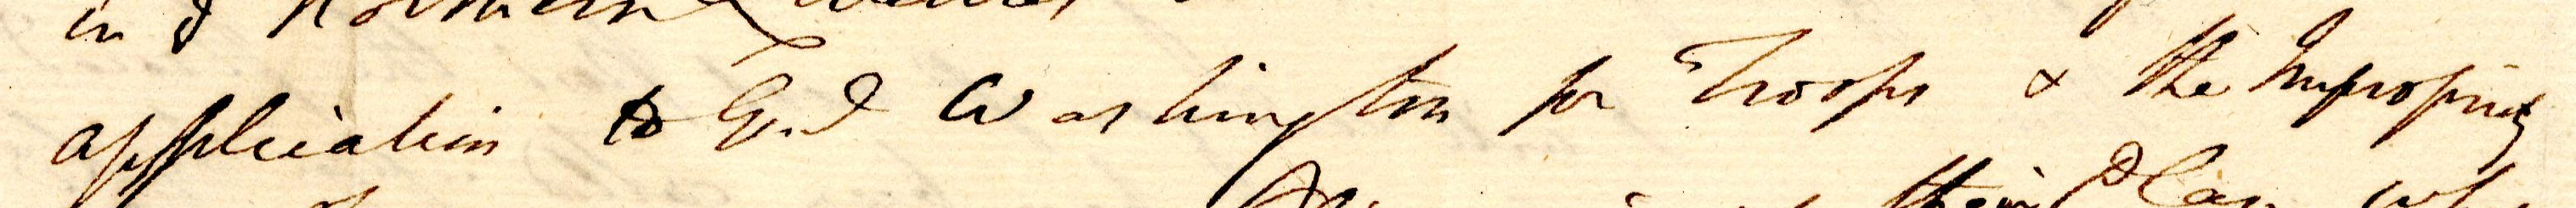application to Gen^l Washington for Troops & the Impropriety
